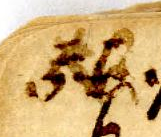56
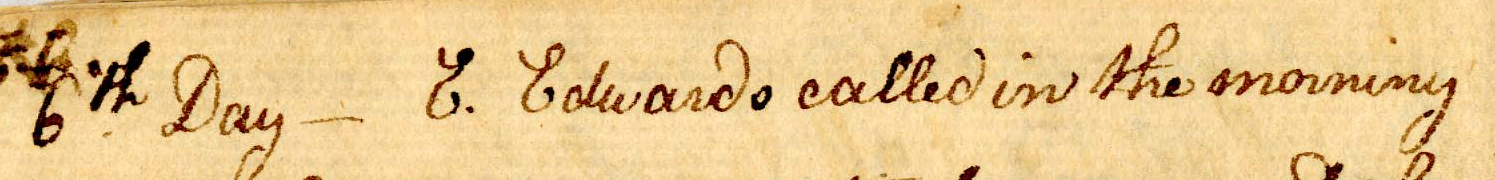6^th Day- E. Edwards called in the morning
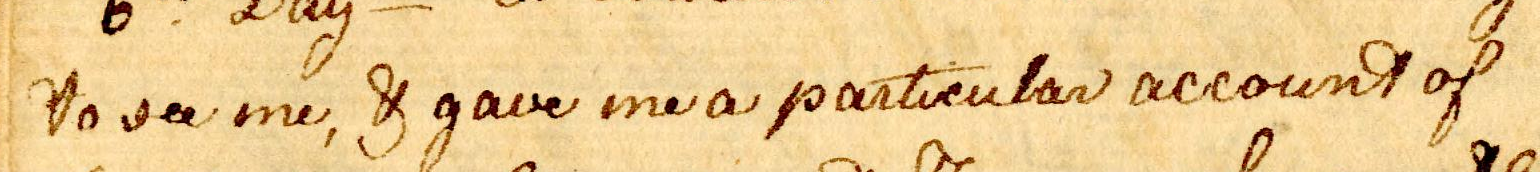to see me, & gave me a particular account of
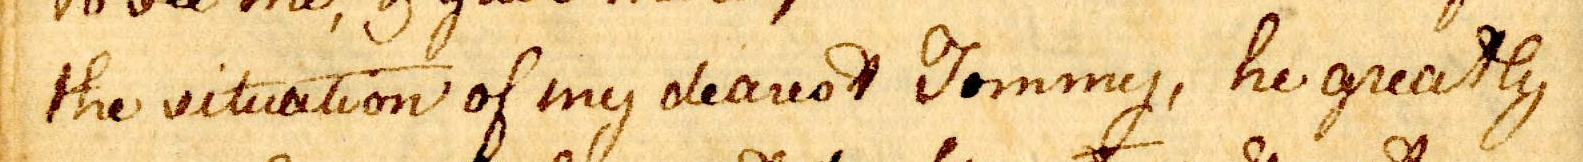the situation of my dearest Tommy, he greatly
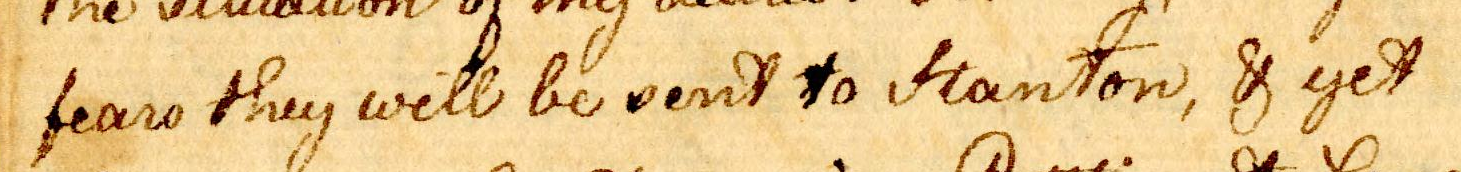fears they will be sent to Stanton, & yet
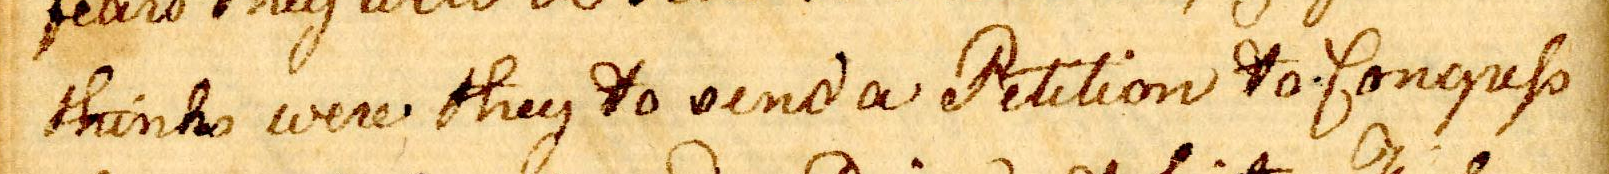thinks were they to send a Petition to Congress
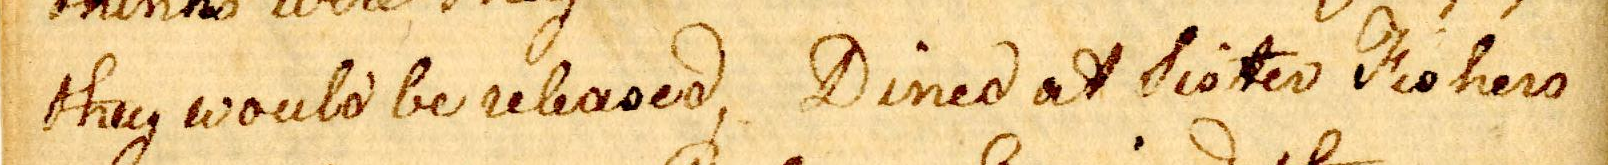thy would be released, Dined at Sister Fishers
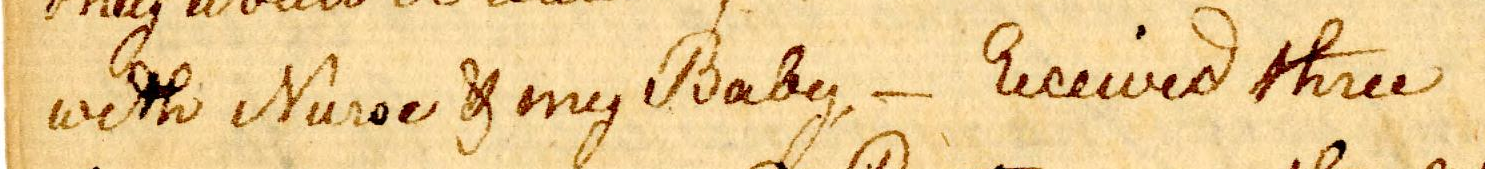with Nurse & my Baby,- Received three
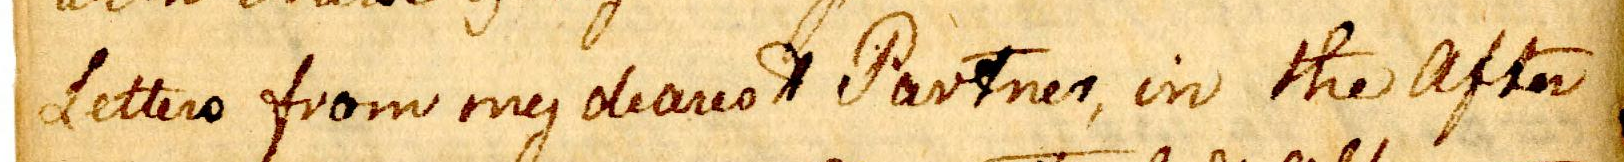Letters from my dearest Partner, in the After
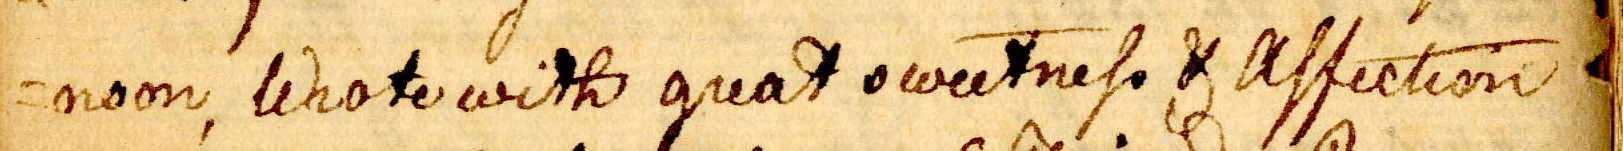-noon, Wrote with great sweetness & Affection
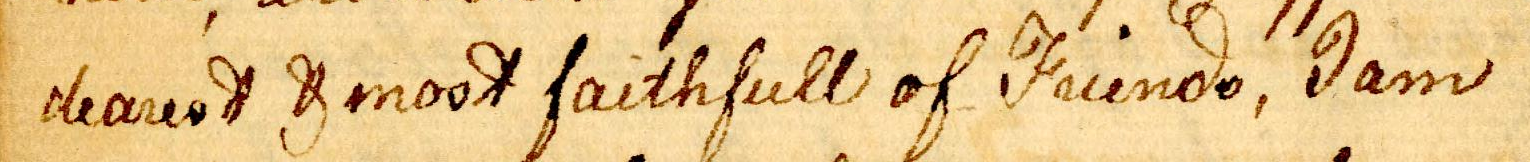dearest & most faithfull of Friends, I am
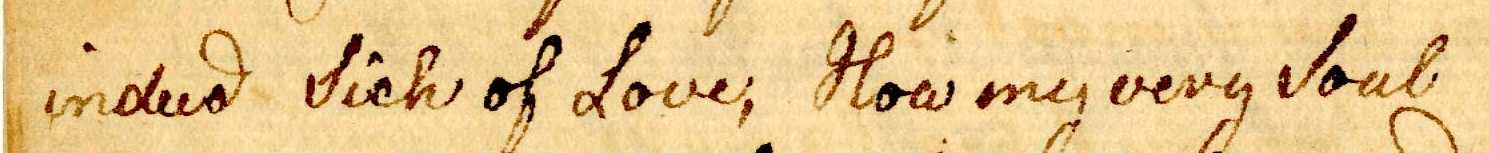indeed Sick of Love, How my very Soul
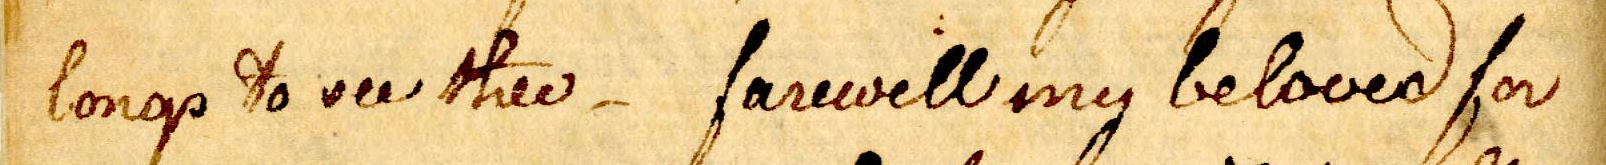longs to see thee- farewell my beloved for
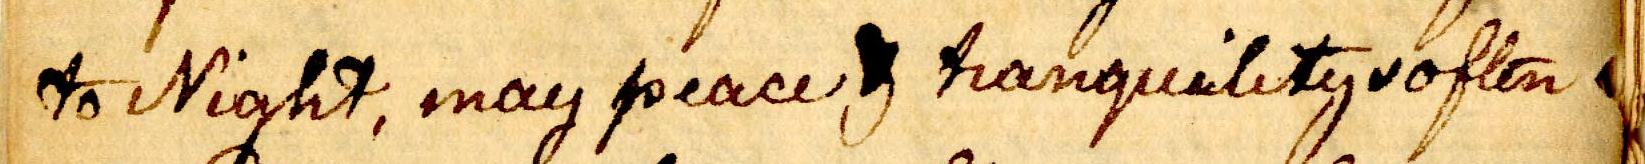to Night, may peace & tranquility soften
